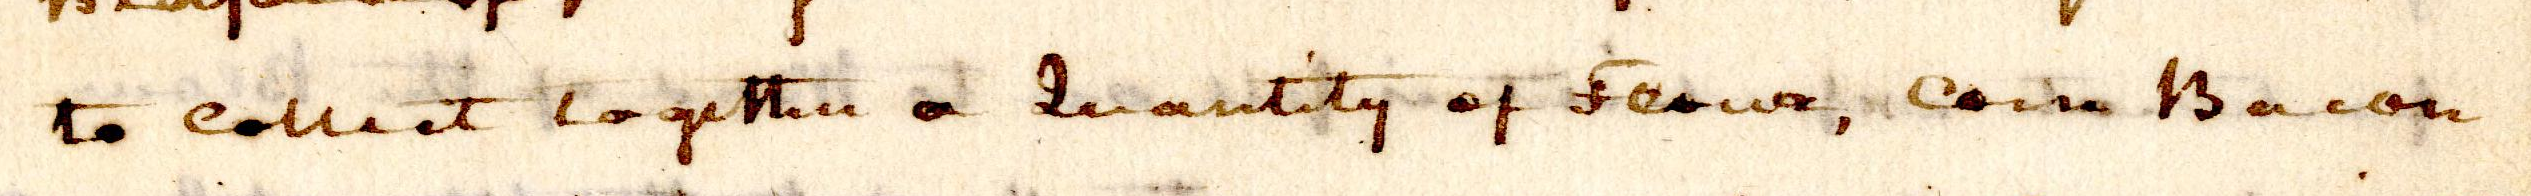to collect together a Quantity of Flour, Corn Bacon
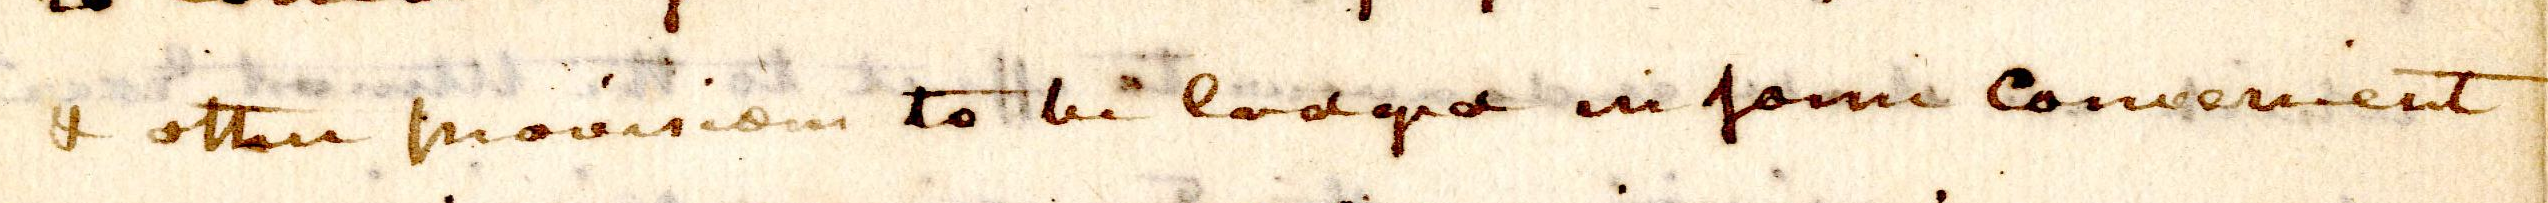& other provisions to be lodged in some Convenient
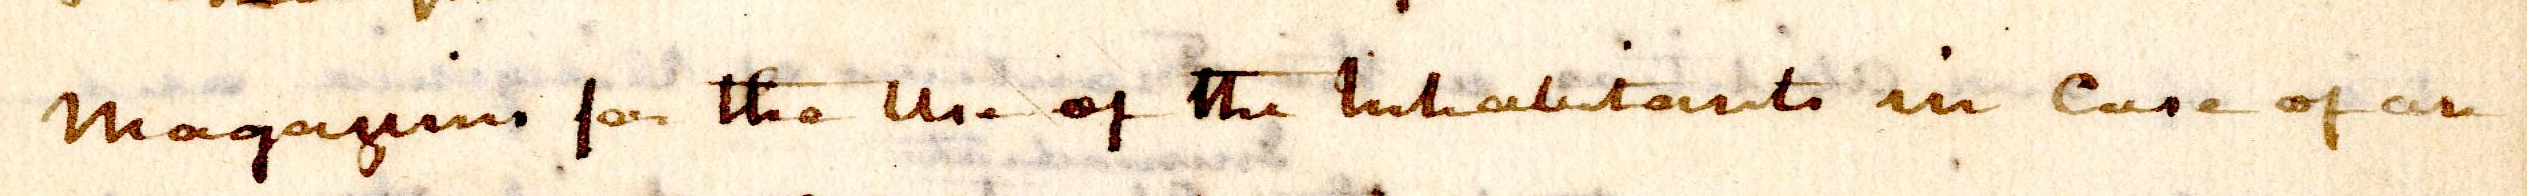Magazines for the Use of the Inhabitants in Case of an
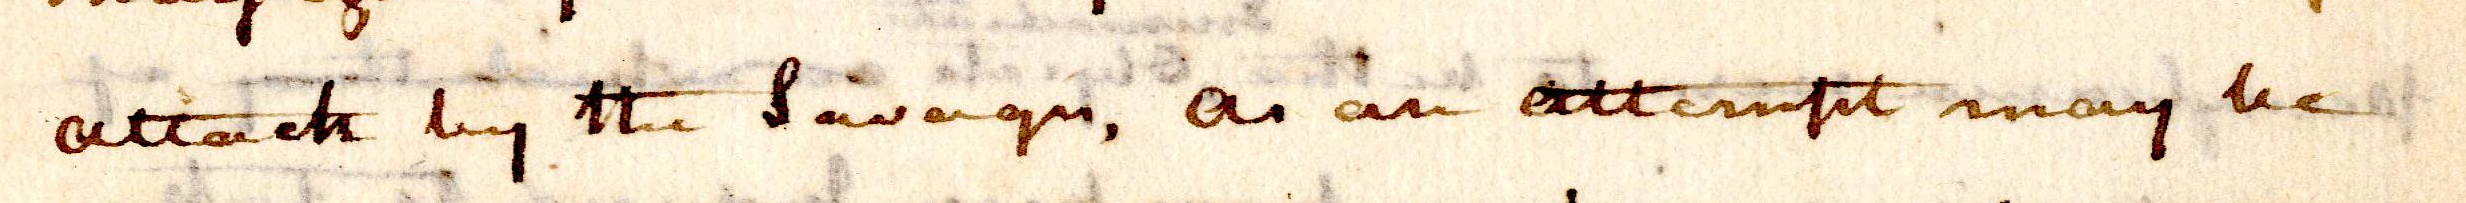attack by the Savages, As an attempt may be
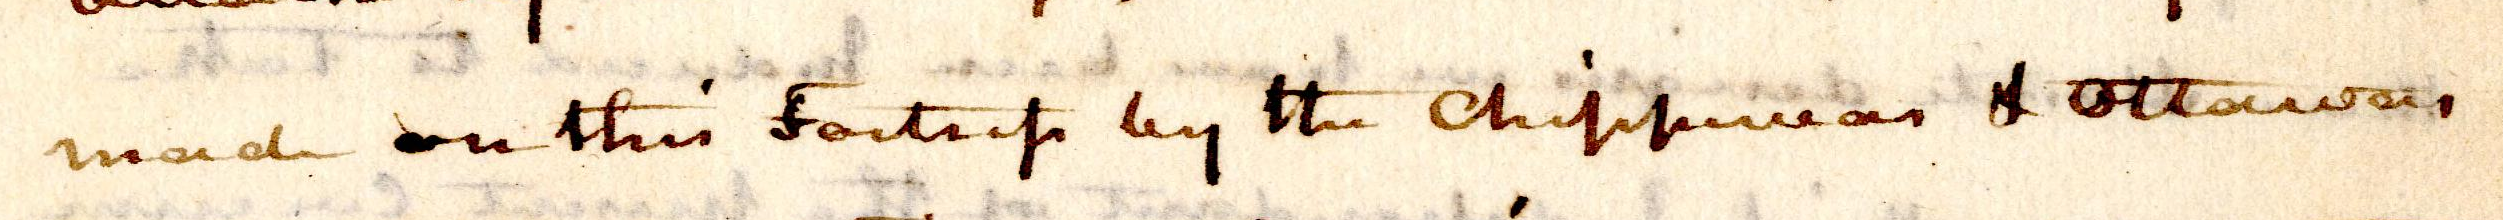made on this Fortress by the Chippawas & Ottawas
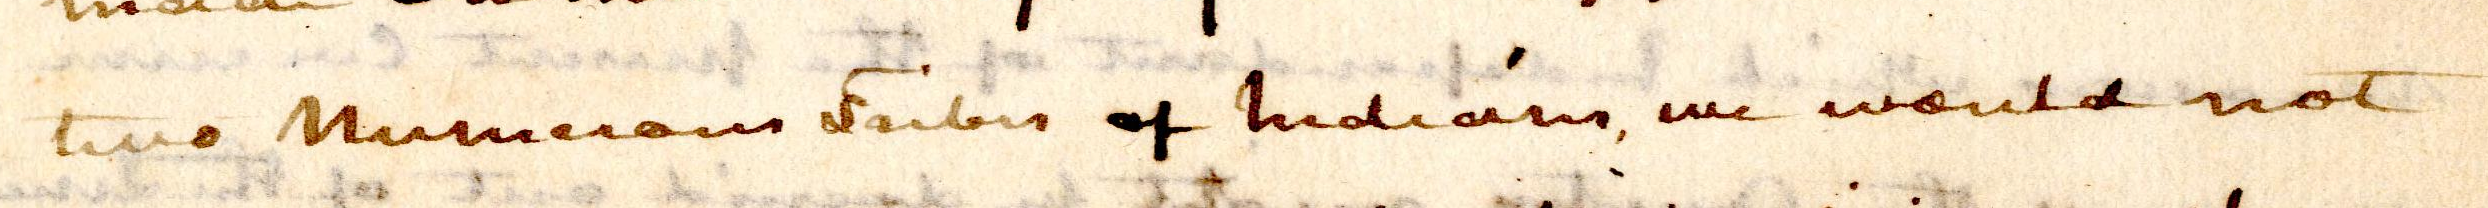two Numerous Tribes of Indians, we would not
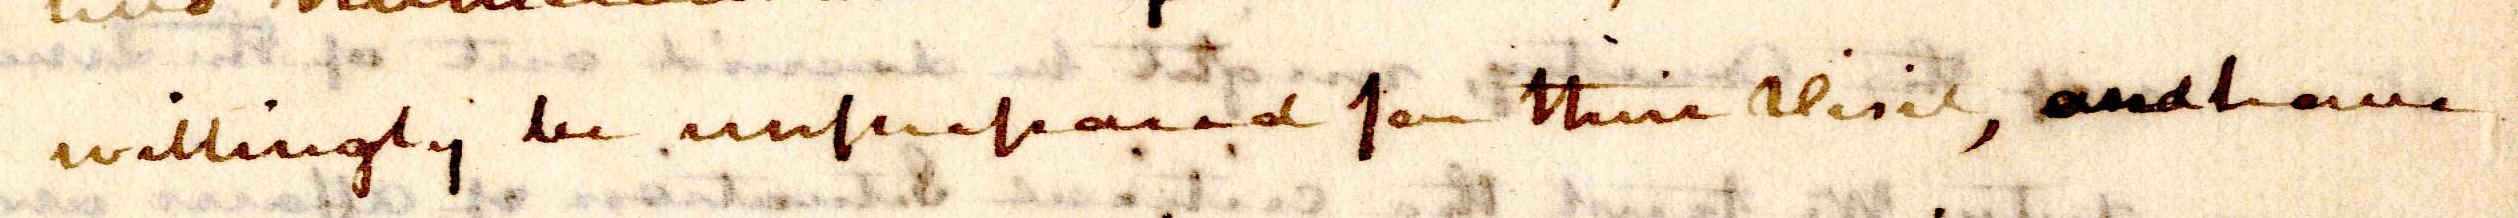willingly be unprepared for their Visit, and have
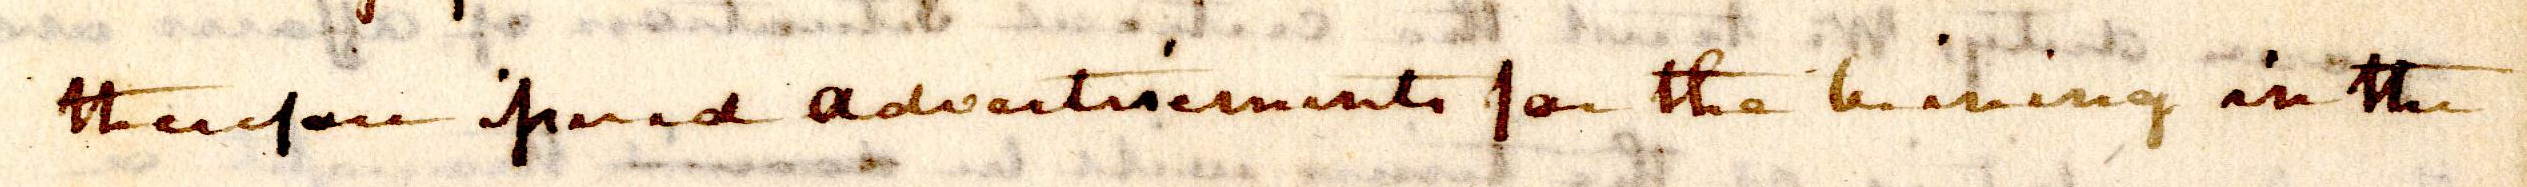therefore issued Advertisements for the having in the
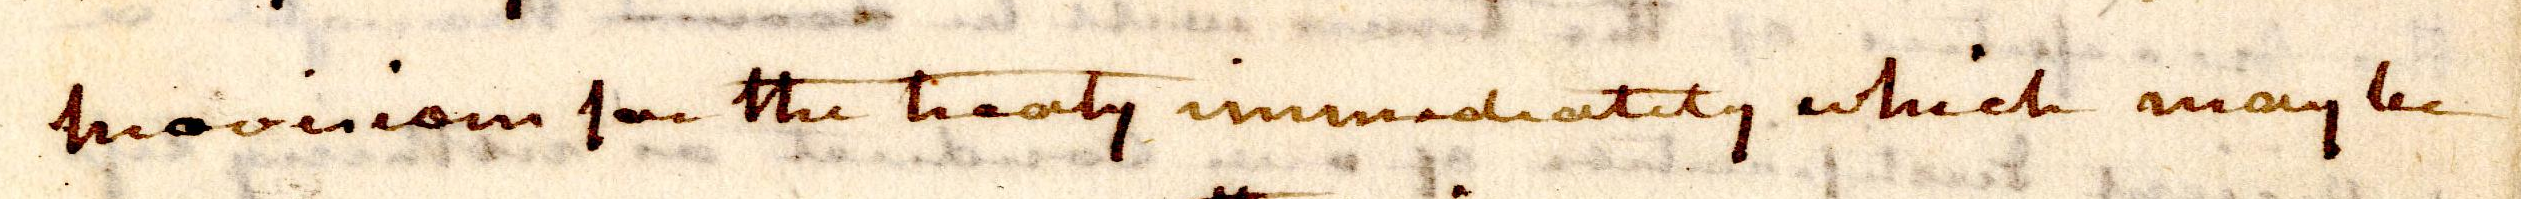provisions for the treaty immediately which may be
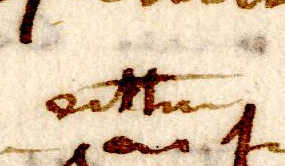either
